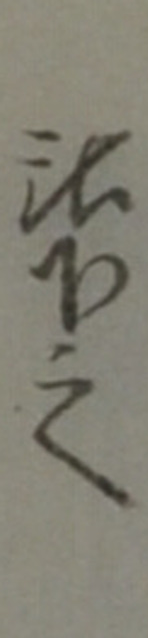被下之
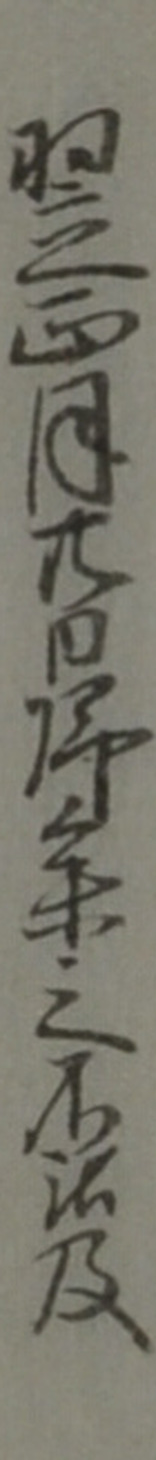翌正月廿日帰参之不被及
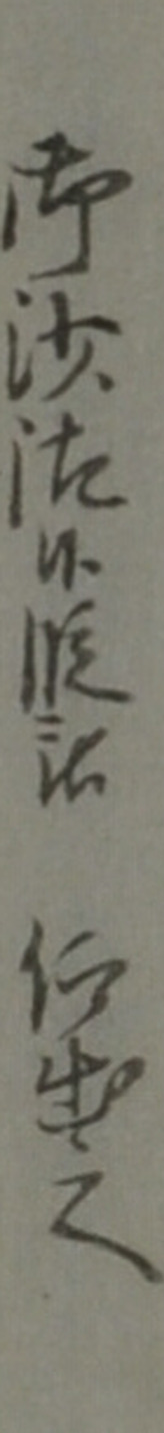御沙汰候段被仰出之
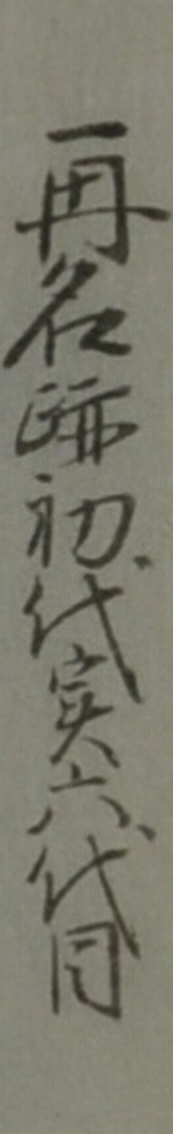再名跡初代実六代目
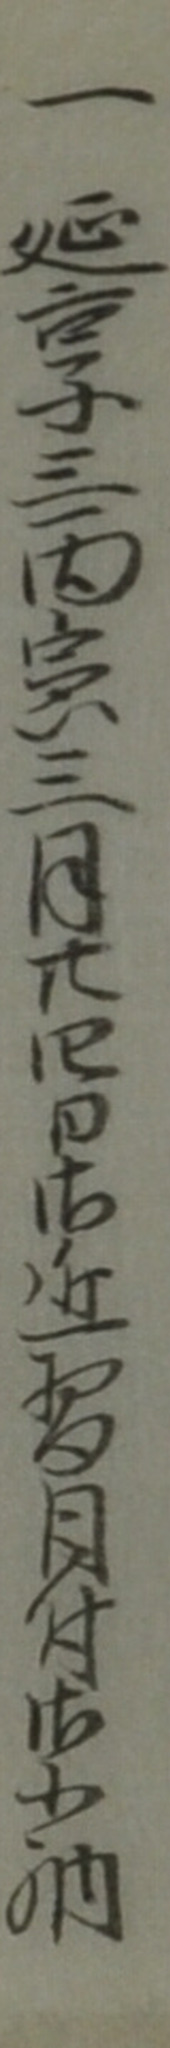一延享三丙寅三月廿四日御近習目付御小納
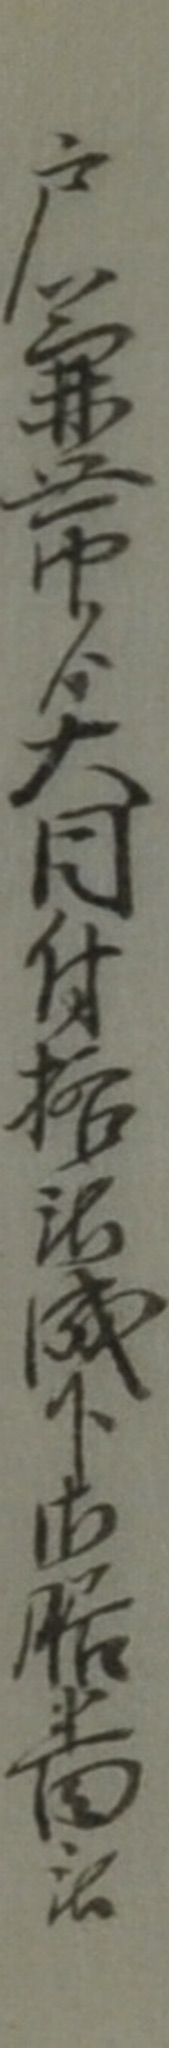戸兼帯ゟ大目付格被成下御膳番被
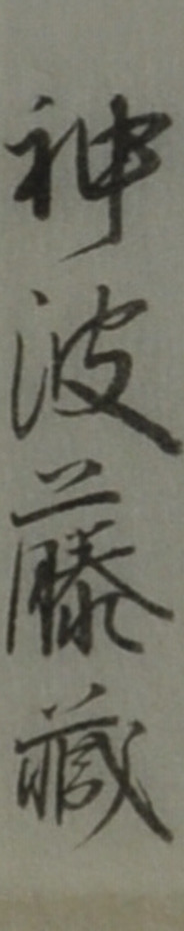神波藤蔵
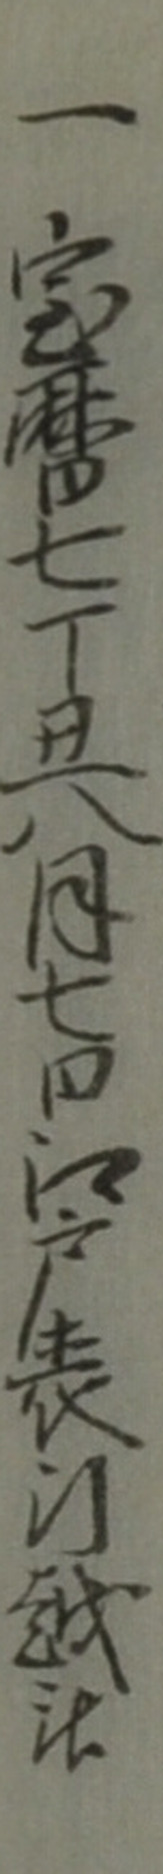宝暦七丁丑八月七日江戸表引越被
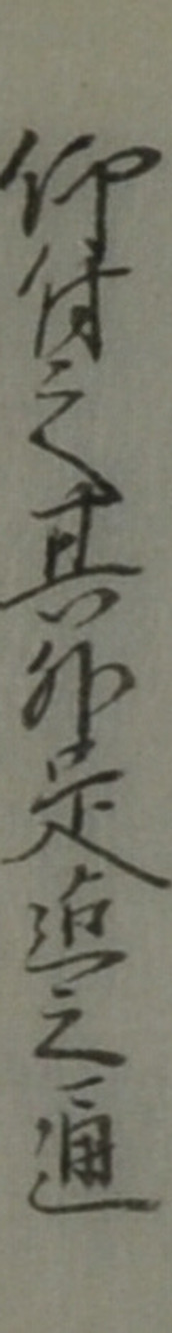仰付之其外是迄之通
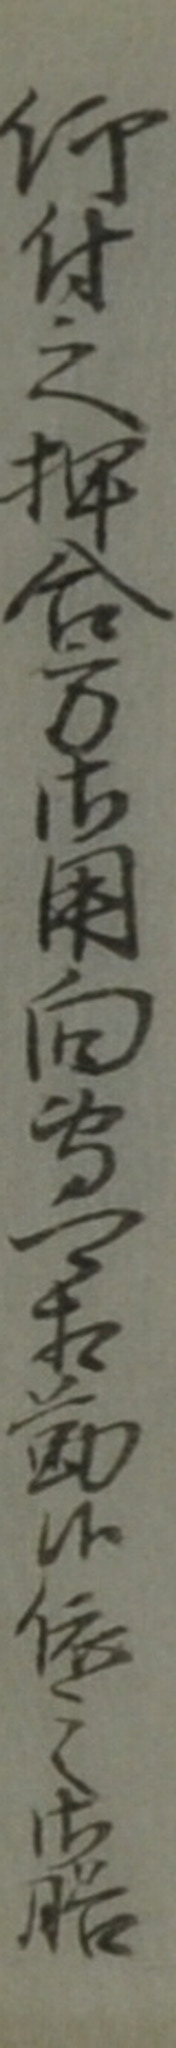仰付之押合方御用向専可相勤候依之御膳
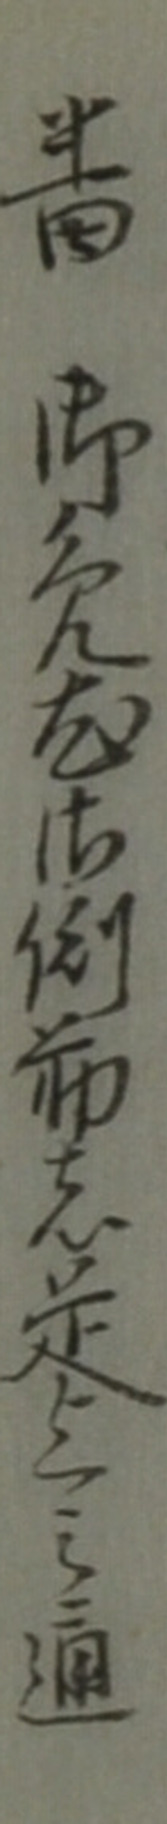番御免尤御側勤者是迄之通
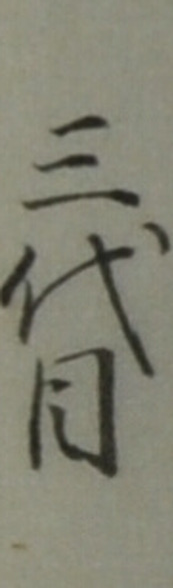三代目

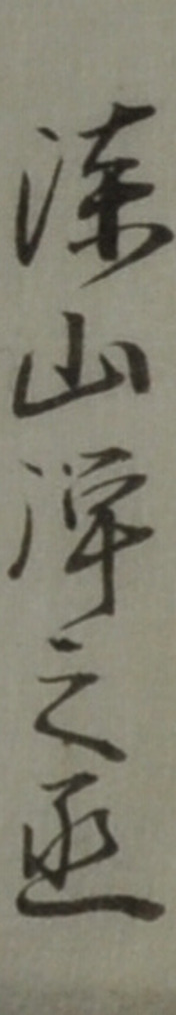漆山弾之丞
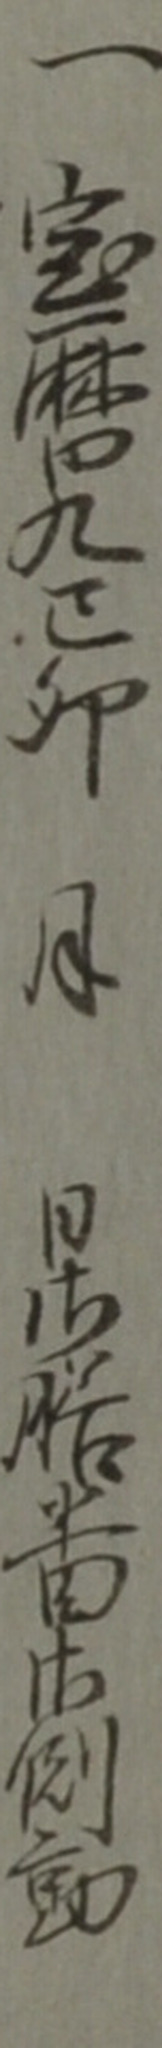一宝暦九巳卯月日御膳番御側勤
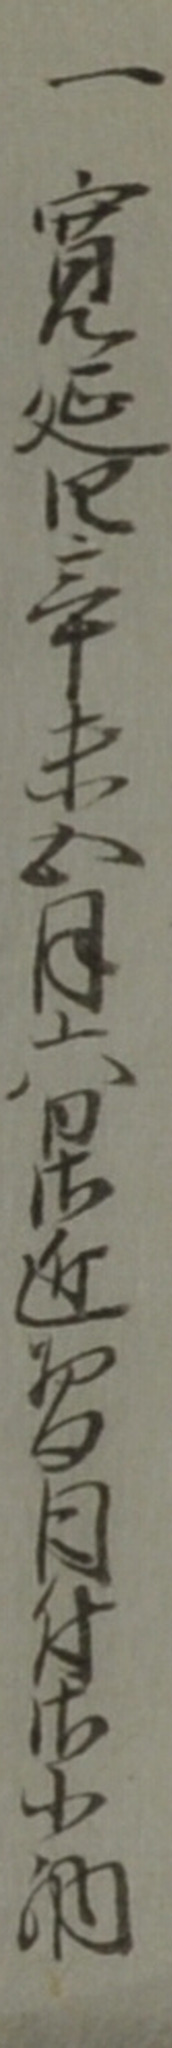一寛延四辛未五月六日御近習目付御小納
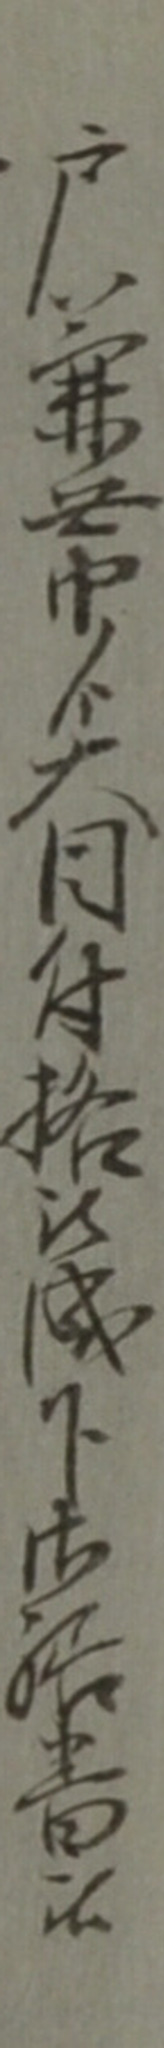戸兼帯ゟ大目付格被成下御膳番被
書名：諸御役代々録（四）
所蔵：伊那市立高遠町図書館・合同会社AMANE
